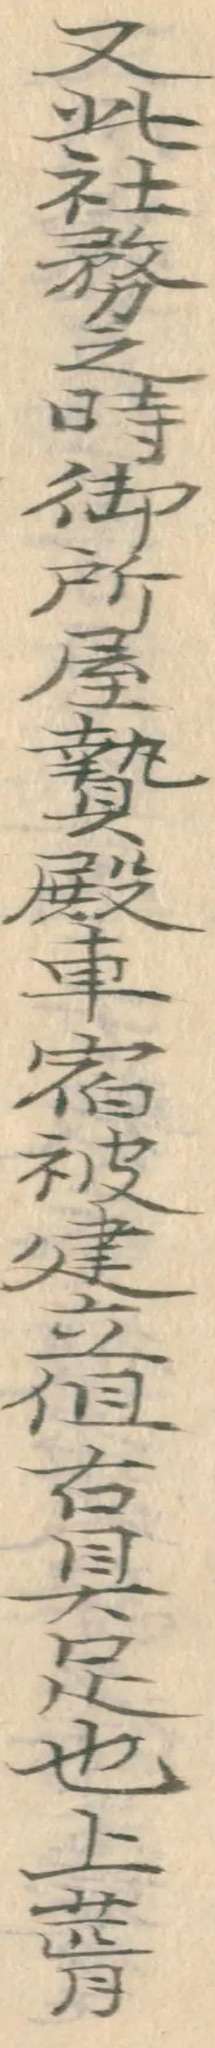又此社務之時御所屋贄殿車宿被建立但右具足也上葺
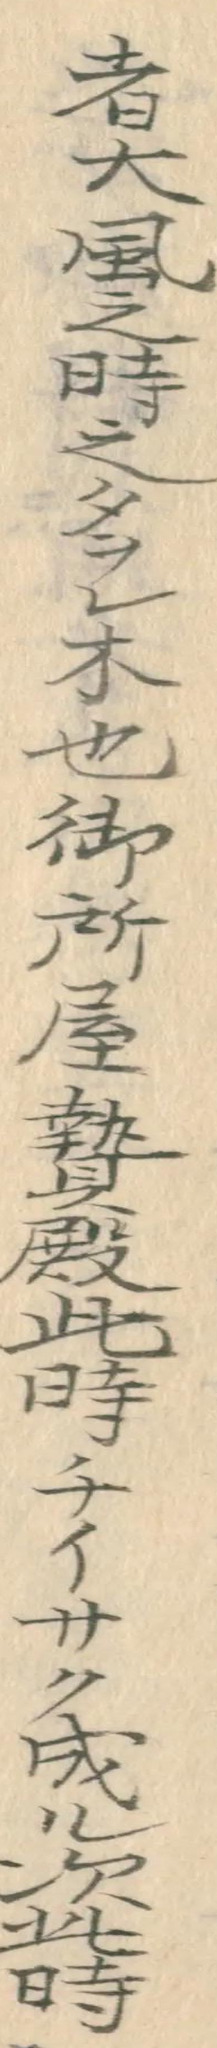者大風之時也タヲレ木也御所屋贄殿此時チイサク成ル次此時
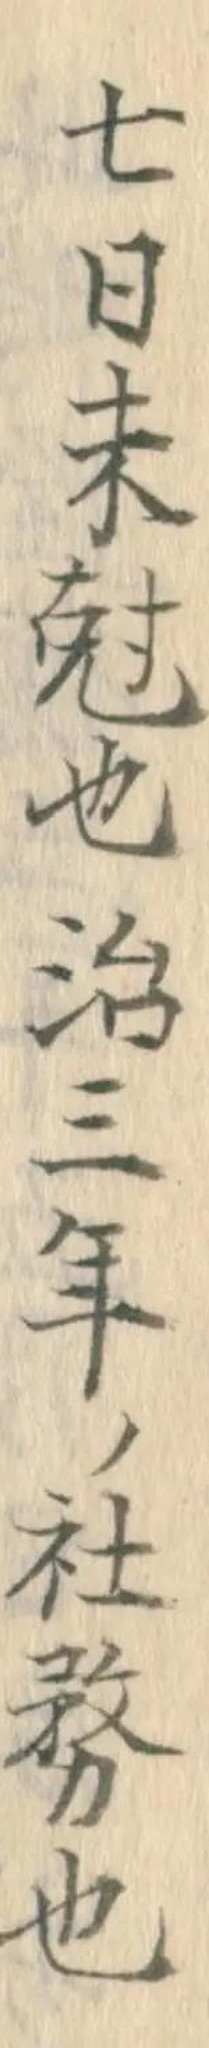七日未尅也治三年ノ社務也
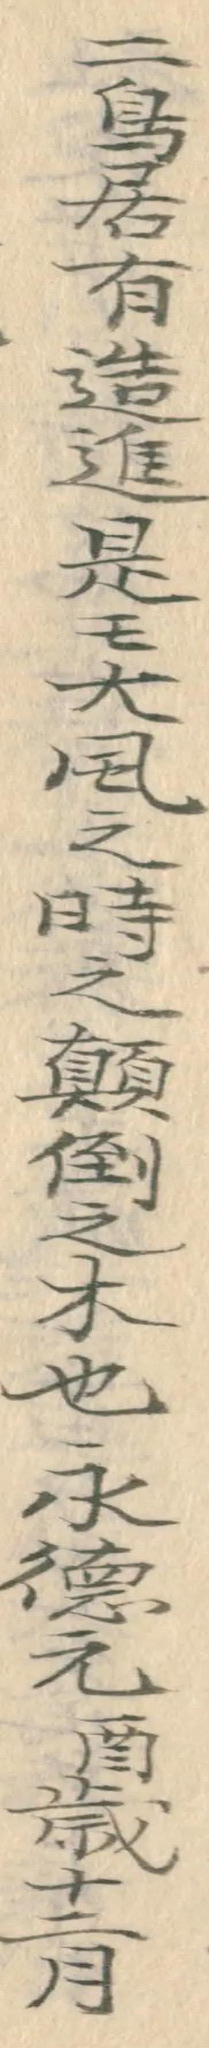二鳥居有造進是モ大風之時之顛倒之木也永徳元酉歳十二月
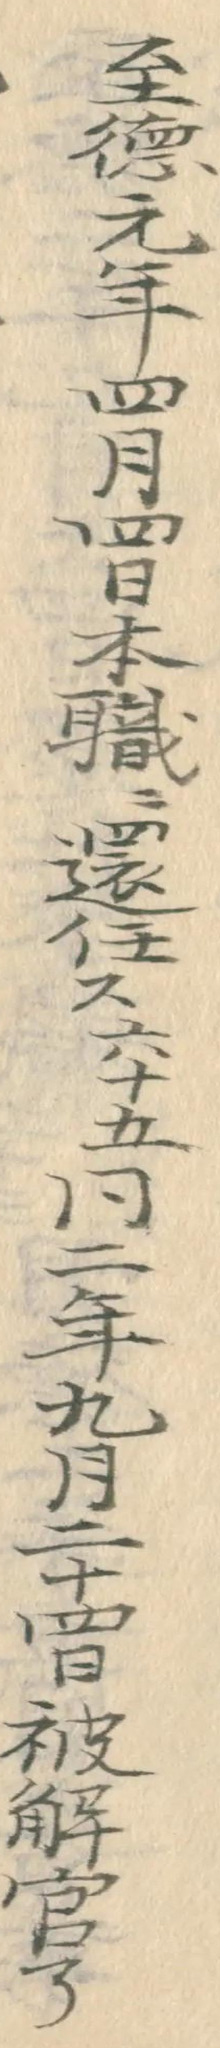至徳元年四月四日本職ニ還任ス六十五同二年九月二十四日被解官了
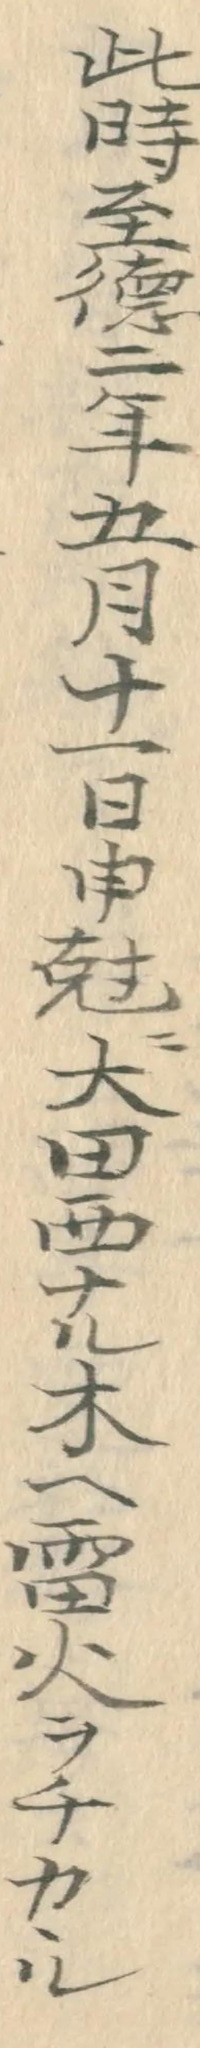此時至徳二年五月十一日申尅ニ大田西ナル木ヘ雷火ヲチカヽル
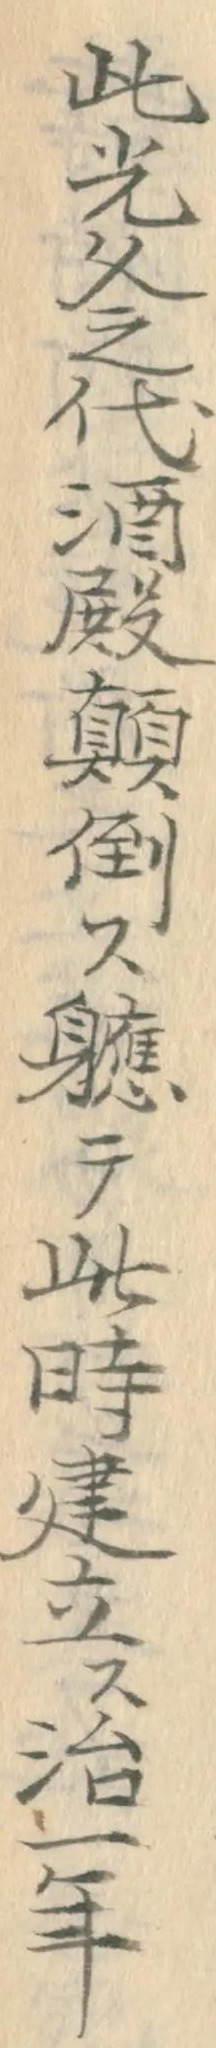此光久之代酒殿顛倒ス軈テ此時建立ス治一年

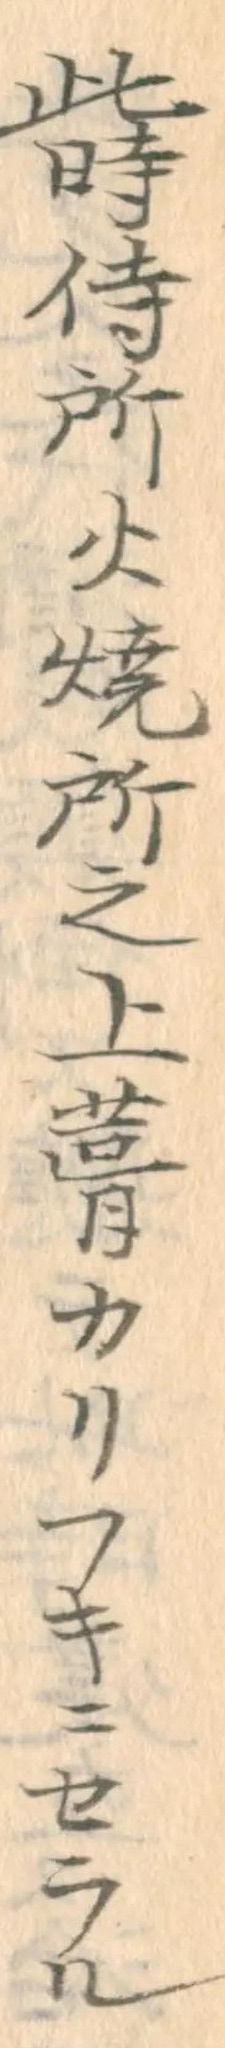此時侍所火焼所之上葺カリフキニセラル
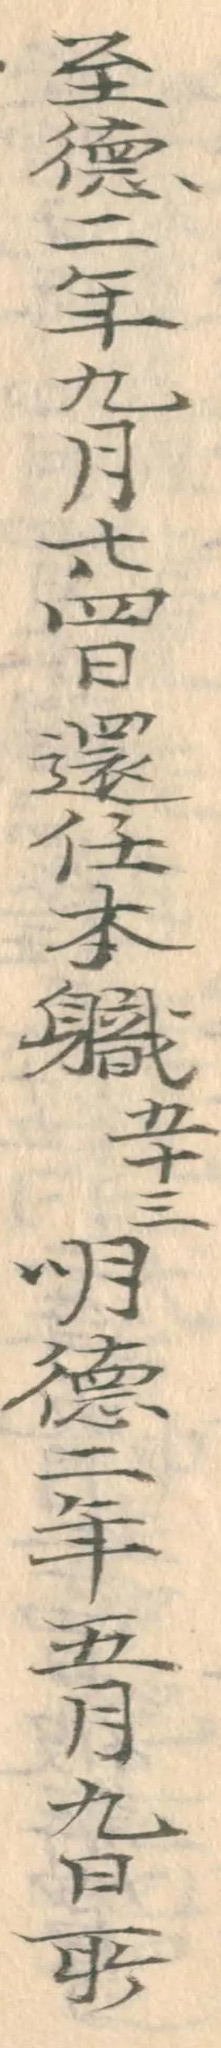至徳二年九月廿四日還任本職五十三明徳二年五月九日所
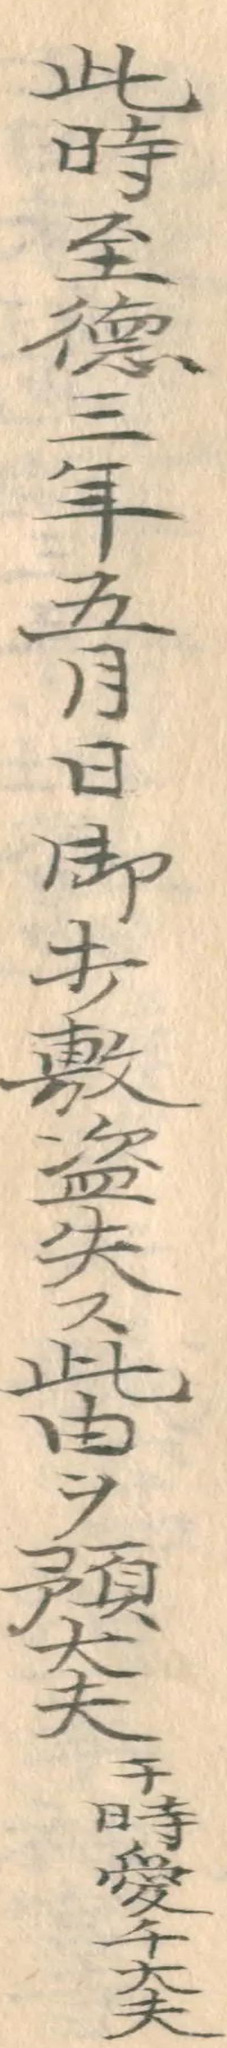此時至徳三年五月日御打敷盗失ス此由ヲ預大夫于時愛千大夫
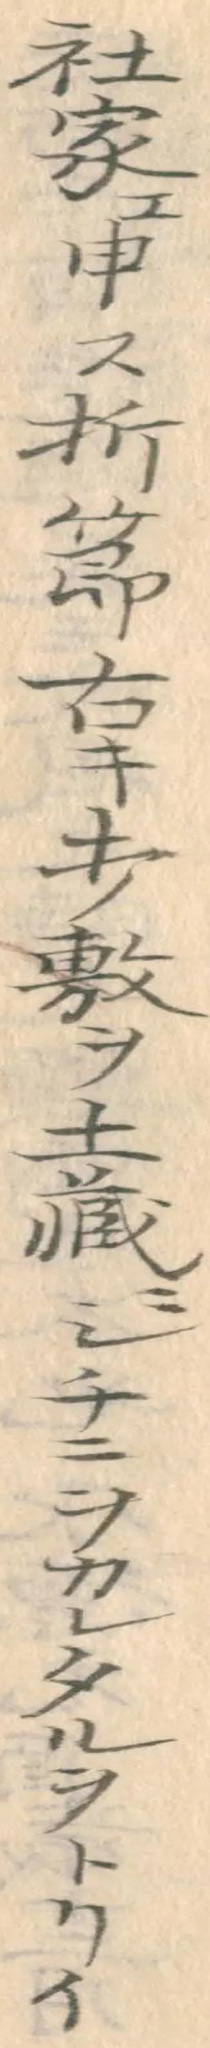社家エ申ス折節古キ打敷ヲ土蔵ニシチニヲカレタルヲトリイ
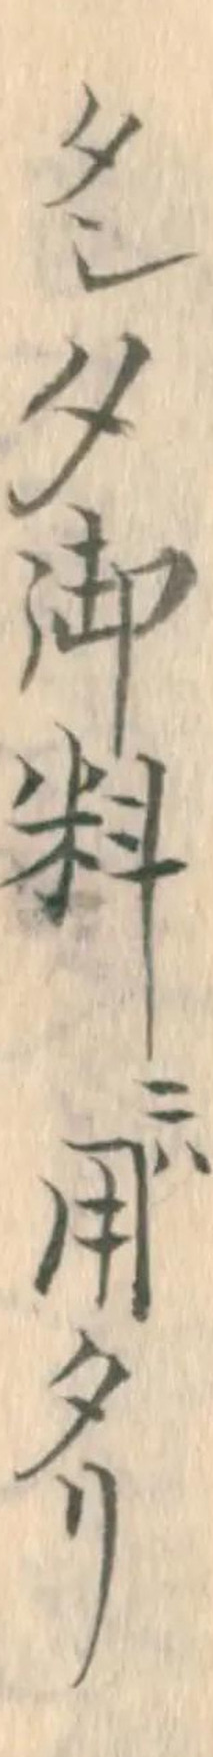タシ夕御料ニハ用タリ
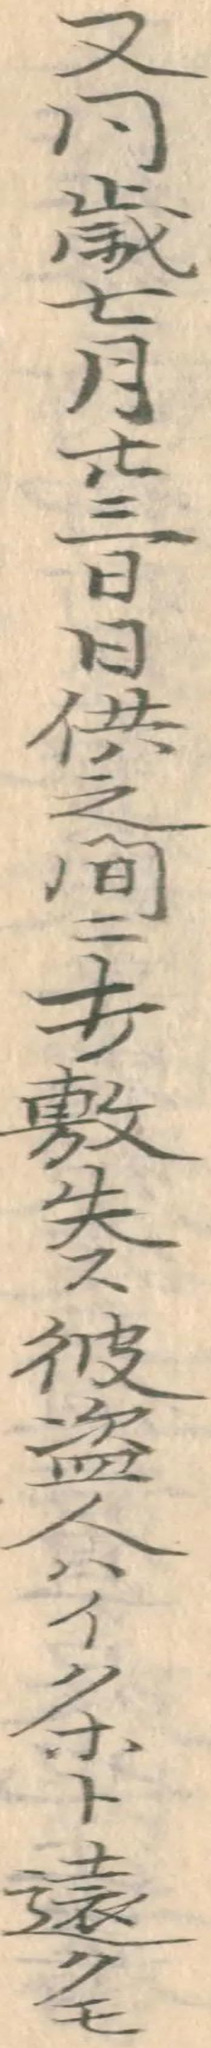又同歳七月廿三日日供之間ニ打敷失ス彼盗人ハイクホト遠クモ
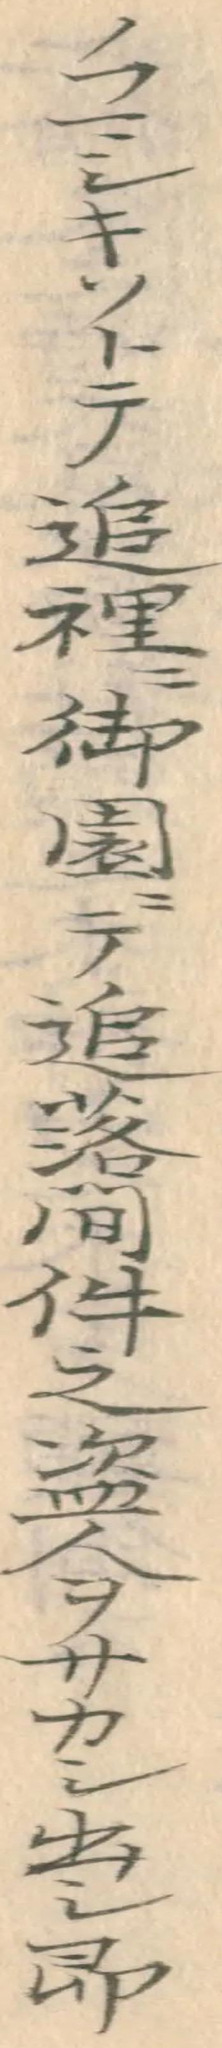ノフマシキソトテ追裡ニ御園ニテ追落間件之盗人ヲサカシ出シ即
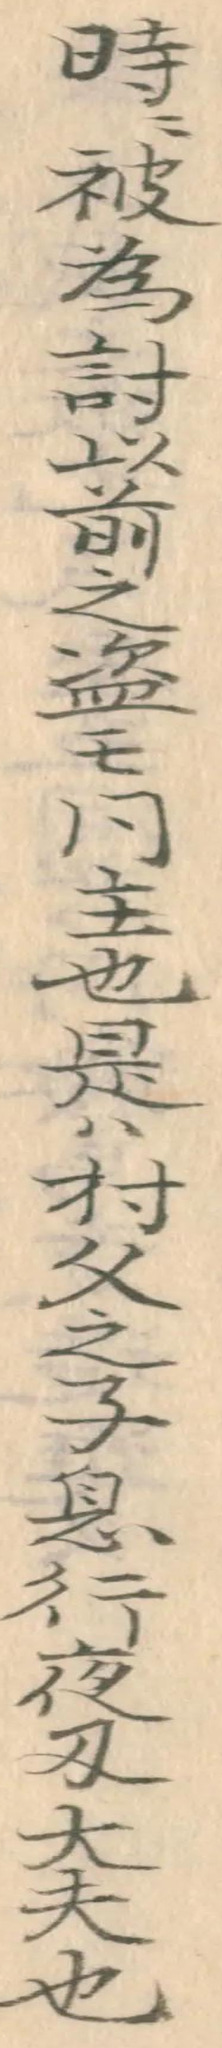時ニ被為討以前之盗モ同主也是ハ村久之子息行夜刃大夫也
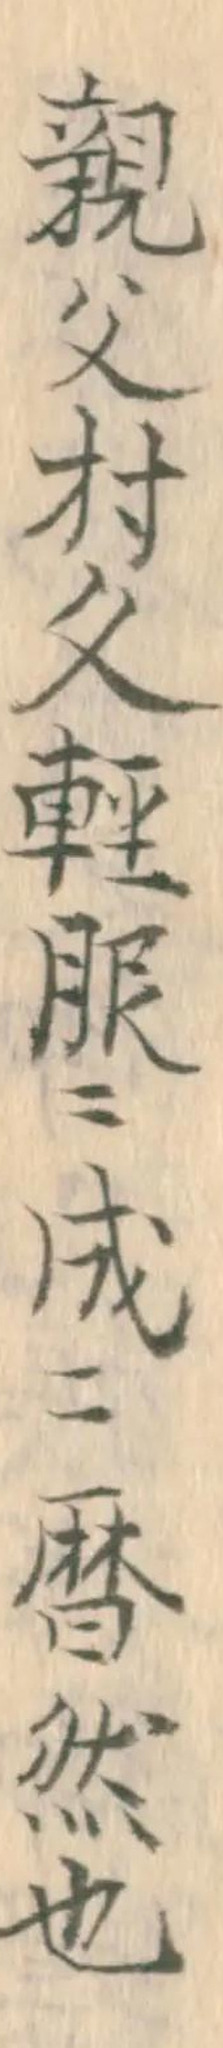親父村久軽服ニ成ニ歴然也
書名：賀茂社記録. 第24冊
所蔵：国立国会図書館 National Diet Library, JAPAN
